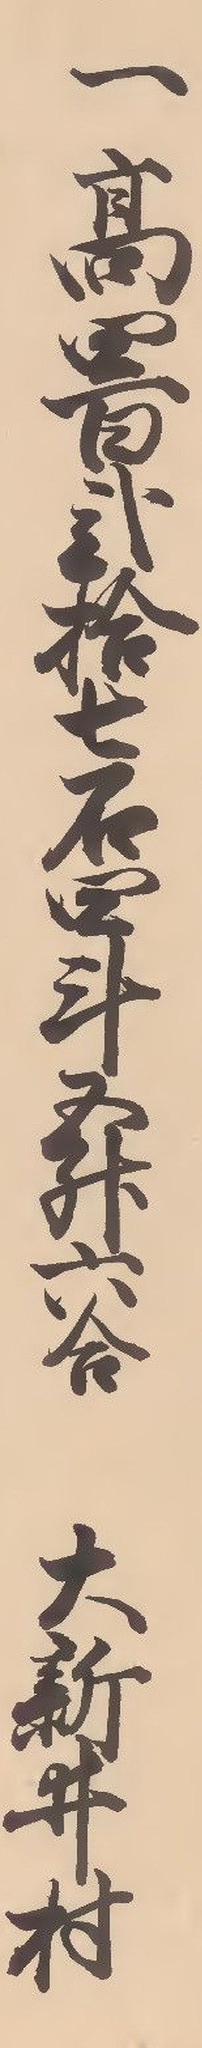一高四百弐拾七石四斗五升六合大新井村
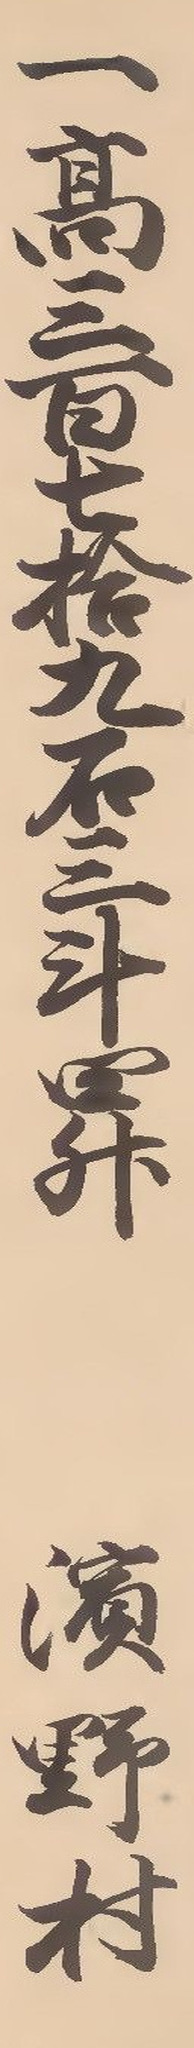一高三百七拾九石三斗四升浜野村
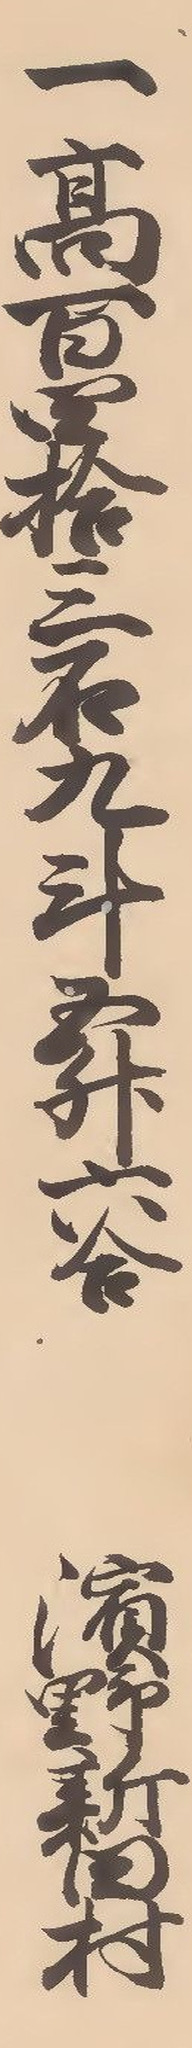一高百四拾三石九斗五升六合浜野新田村
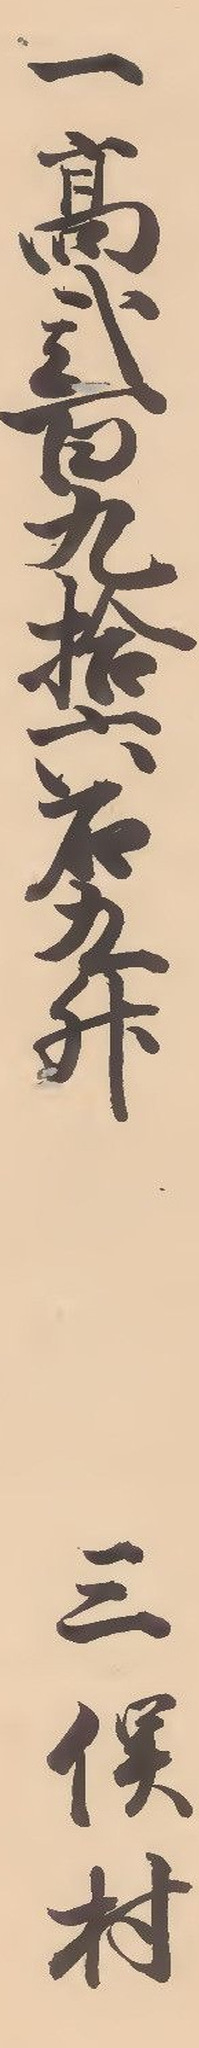一高弐百九拾六石九升三俣村

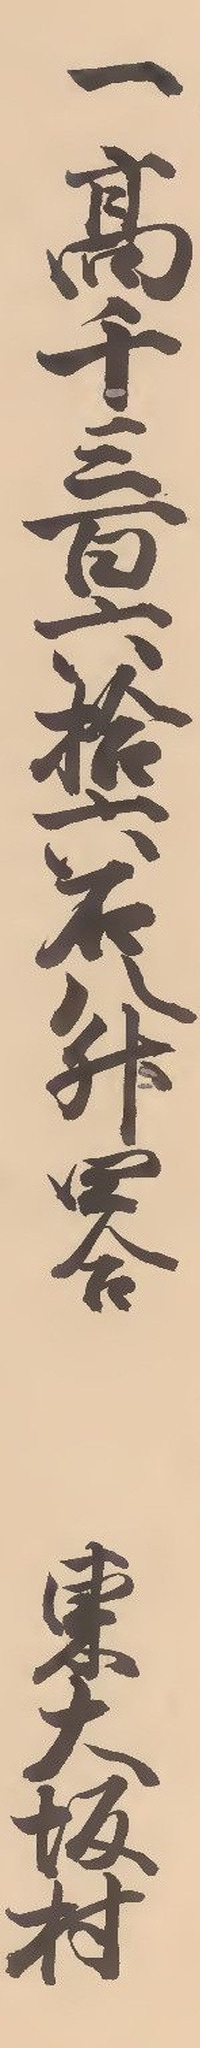一高千三百六拾六石八升四合東大坂村
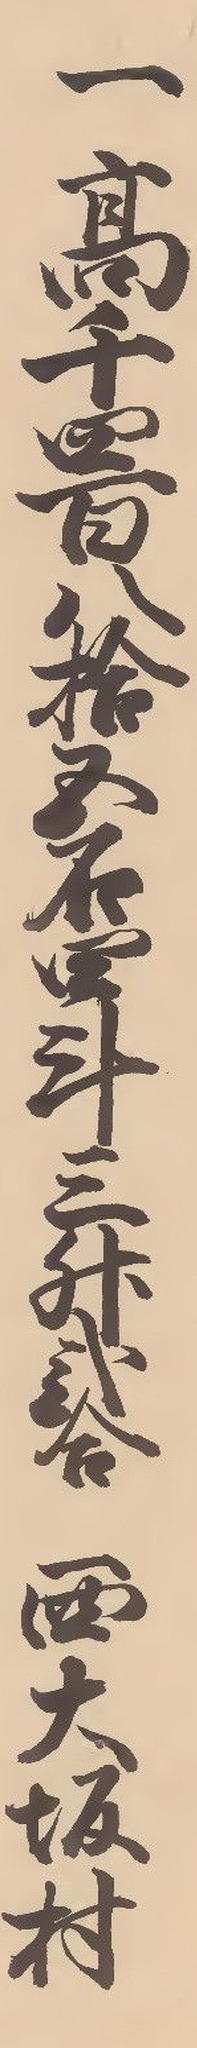一高千四百八拾五石四斗三升弐合西大坂村
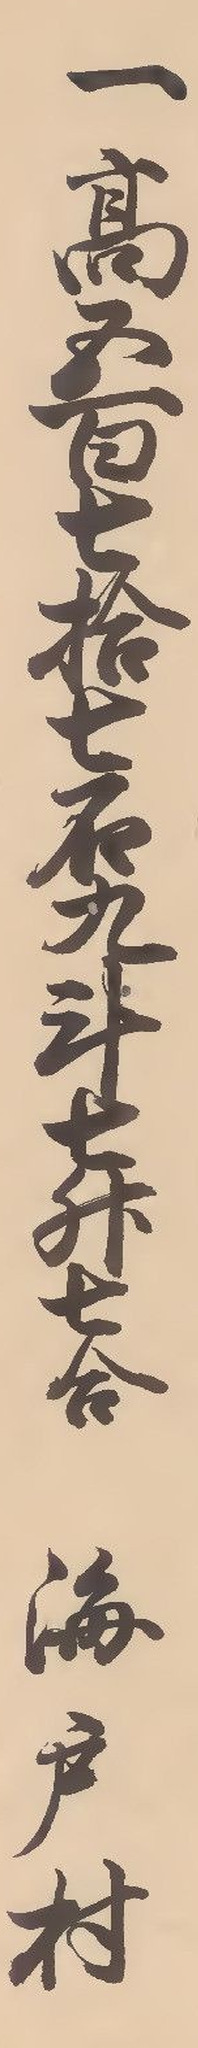一高五百七拾七石九斗七升七合海戸村
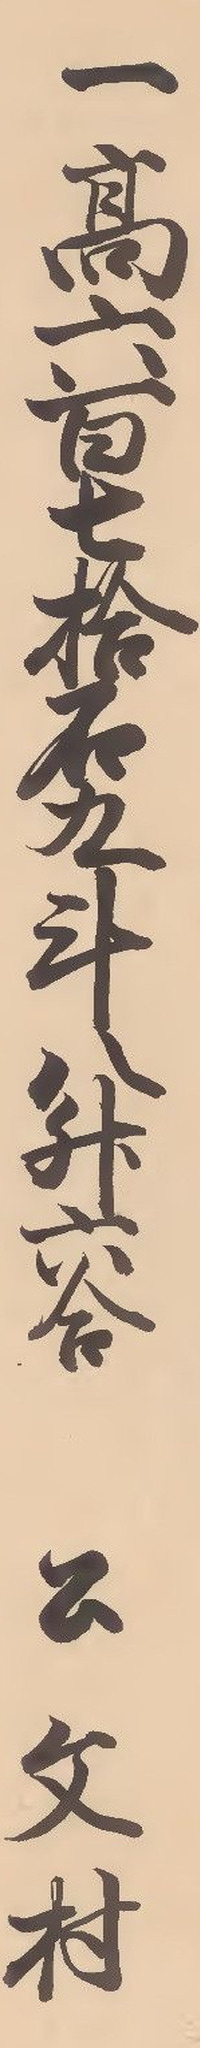一高六百七拾石九斗八升六合公文村
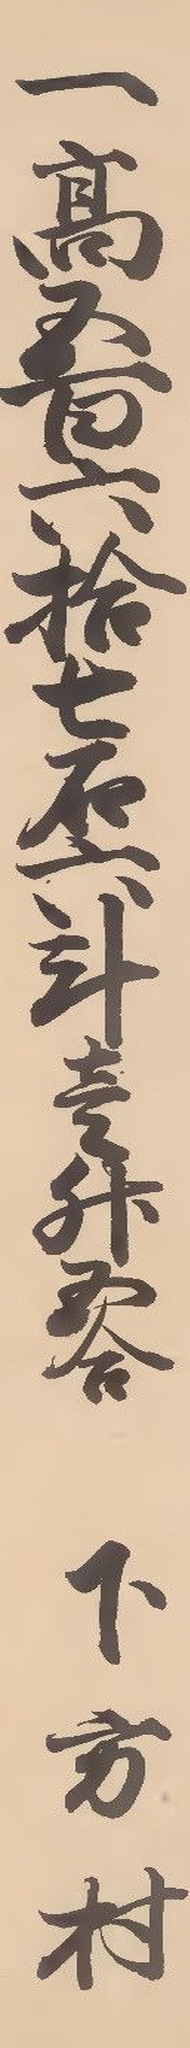一高五百六拾七石六斗壱升五合下方村
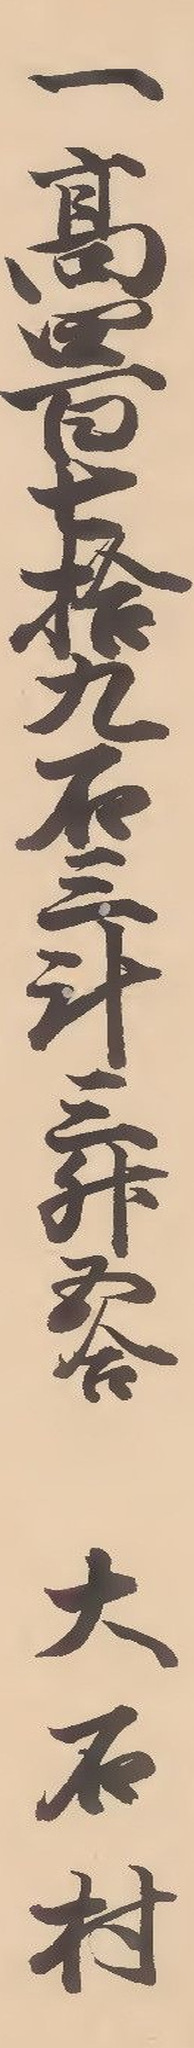一高四百七拾九石三斗三升五合大石村
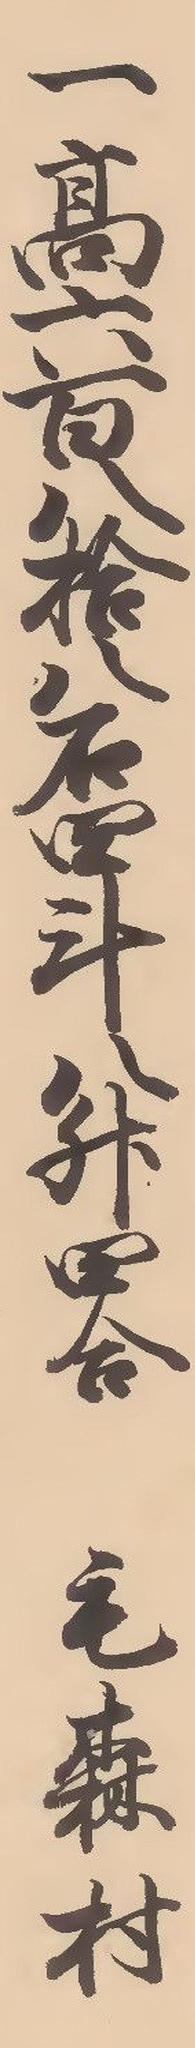一高六百八拾八石四斗八升四合毛森村
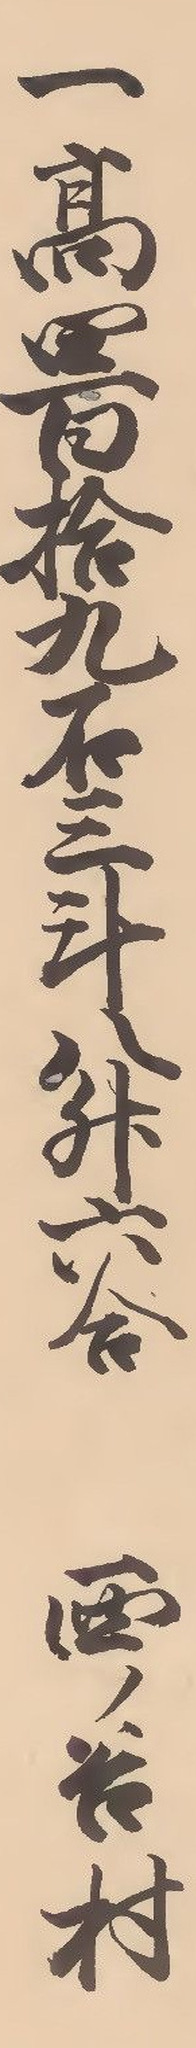一高四百拾九石三斗八升六合西ノ谷村

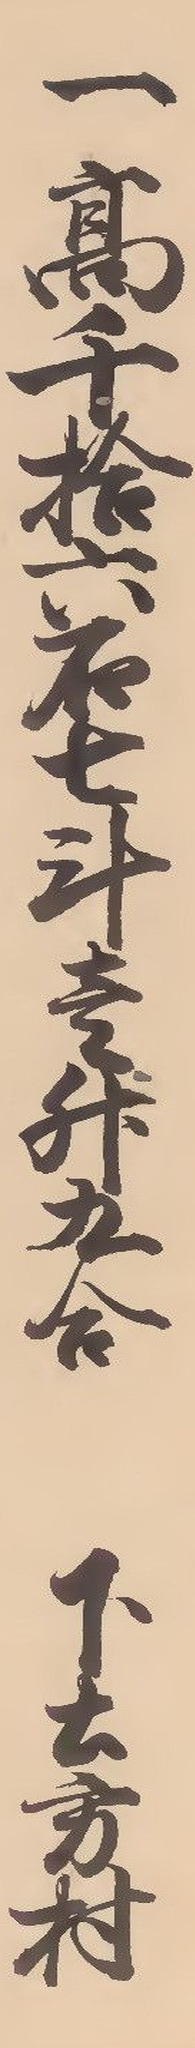一高千拾六石七斗壱升九合下土方村
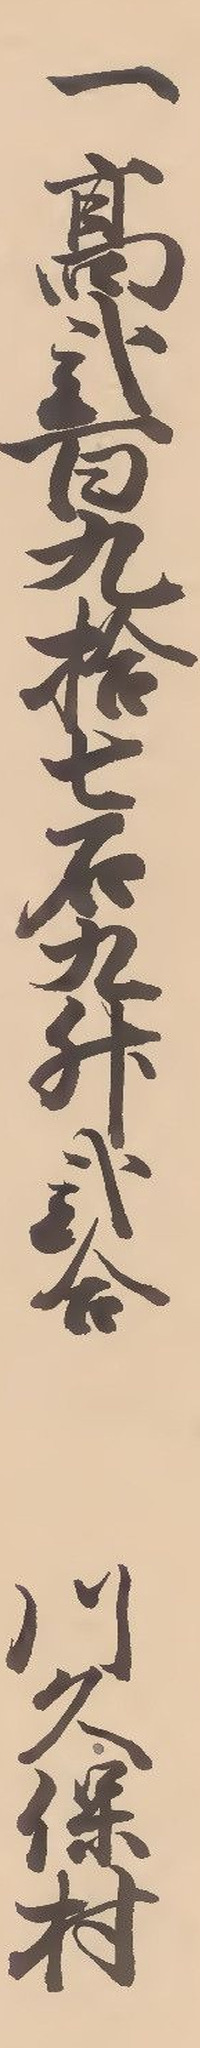一高弐百九拾七石九升弐合川久保村
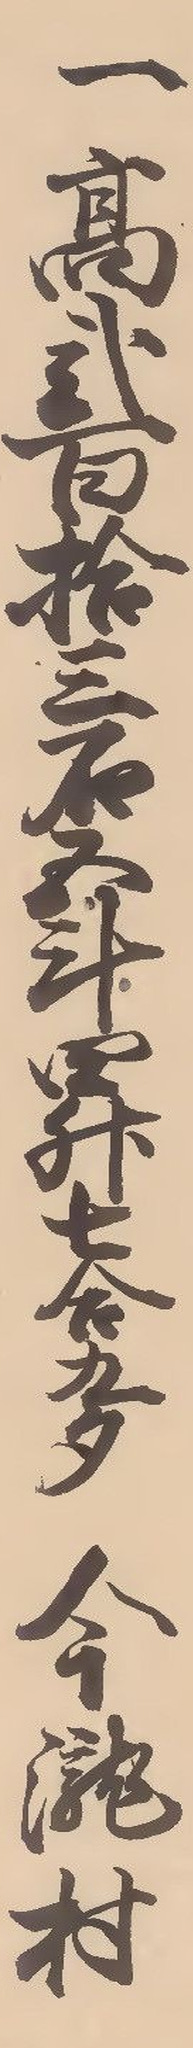一高弐百拾三石五斗四升七合九勺今滝村
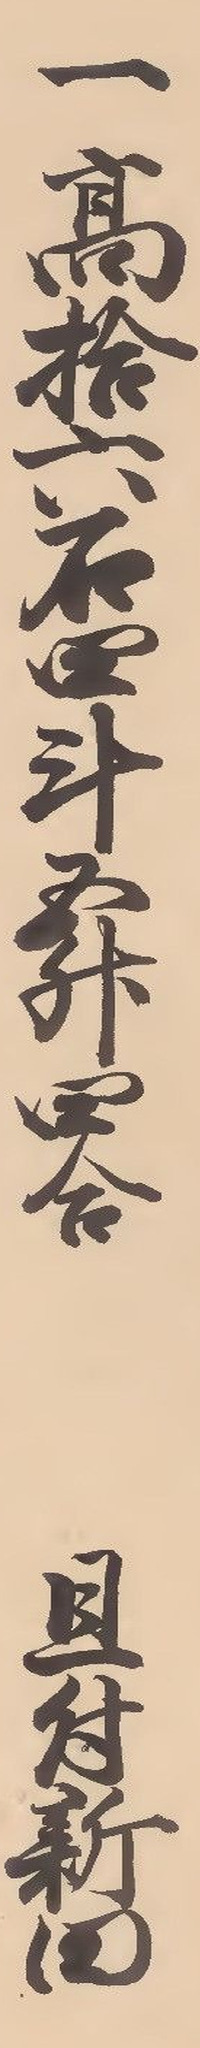一高拾六石四斗五升四合旦付新田
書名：遠江国郷帳
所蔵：国立公文書館 National Archives of Japan
